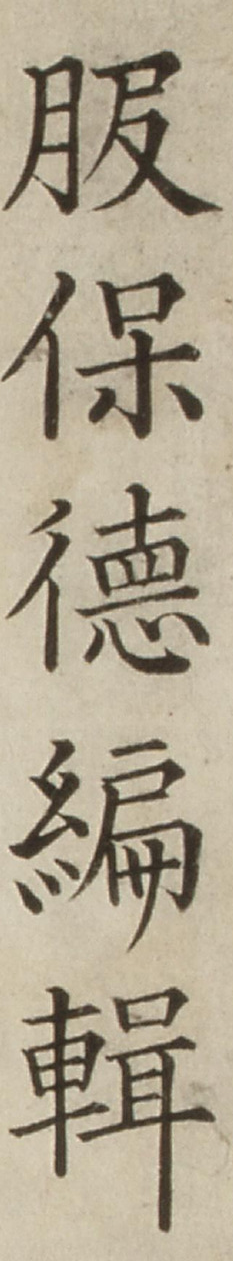服保徳編輯
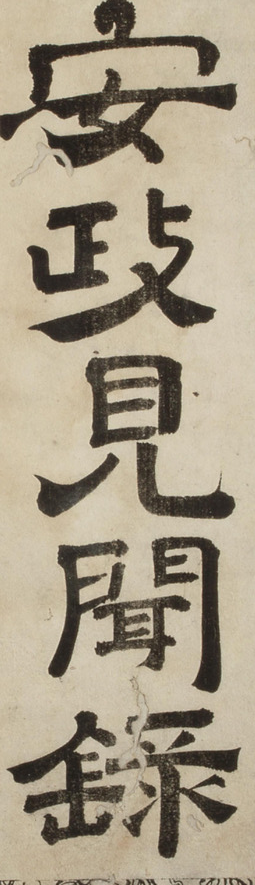安政見聞録
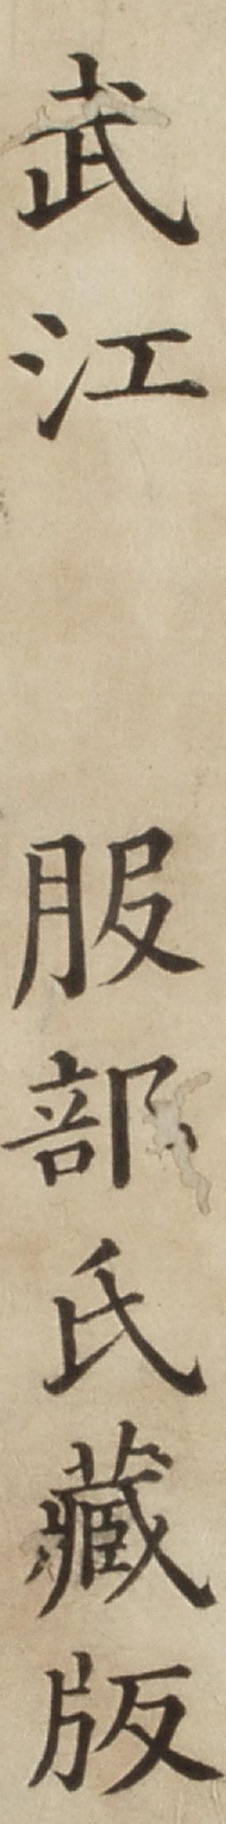武江服部氏蔵版
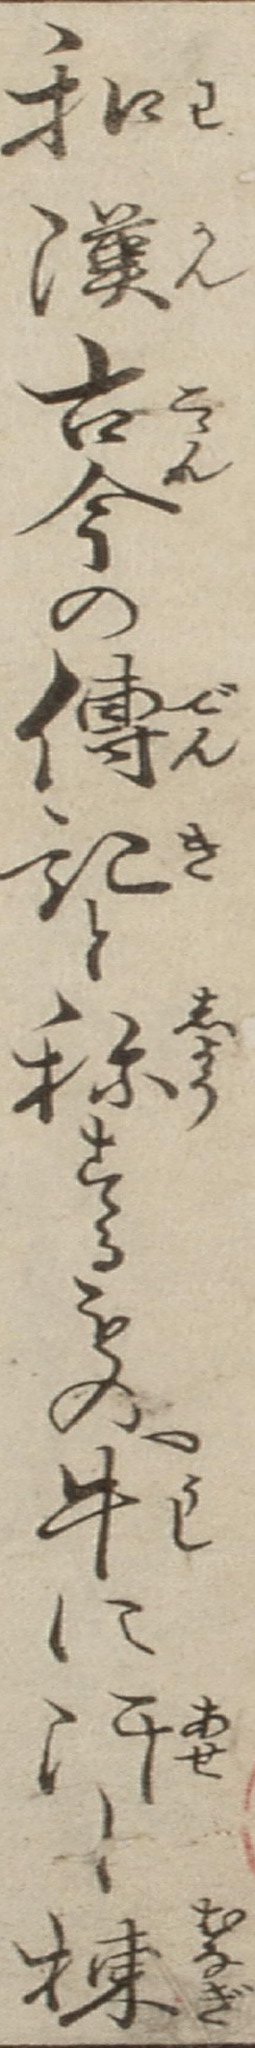和漢古今の伝記と称するもの。牛に汗し棟
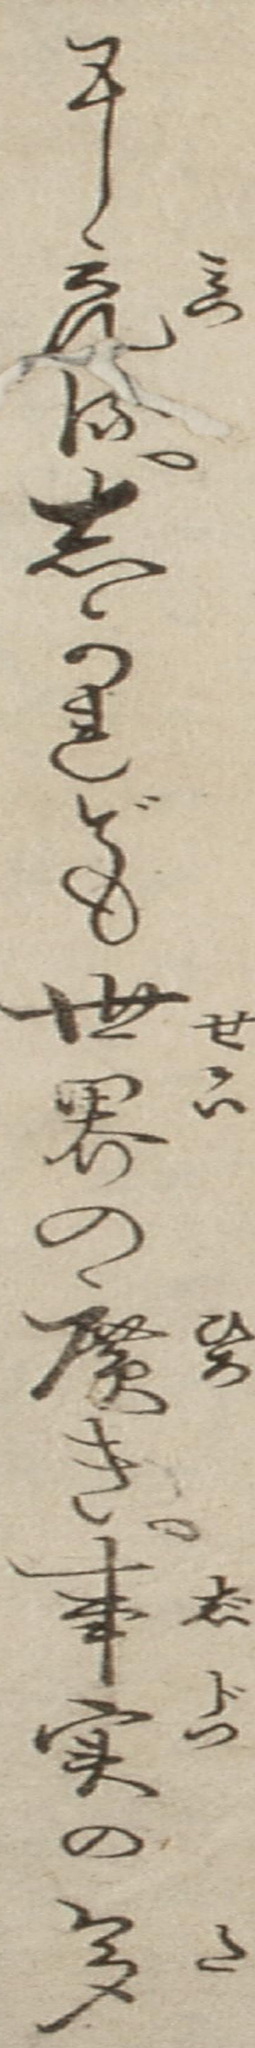に充る。しかれども世界の広き。事実の多
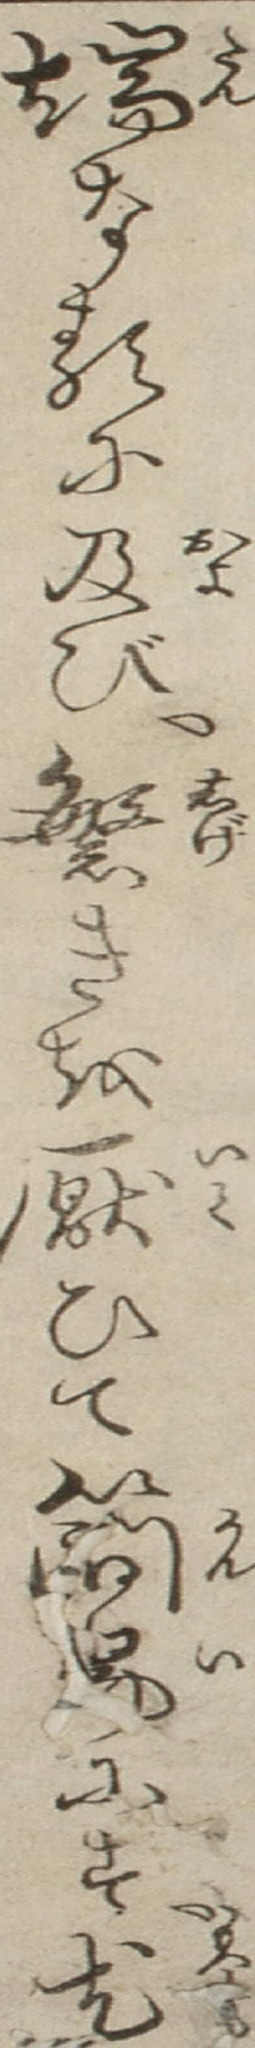端なるに及び。繁きを厭ひて簡易にす。尤
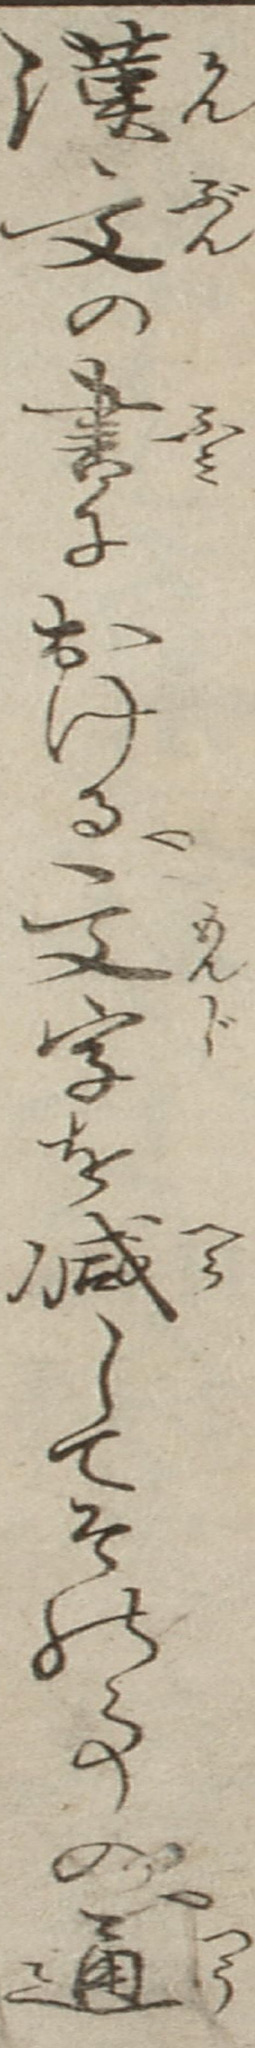漢文の書における。文字を減してその事の。通
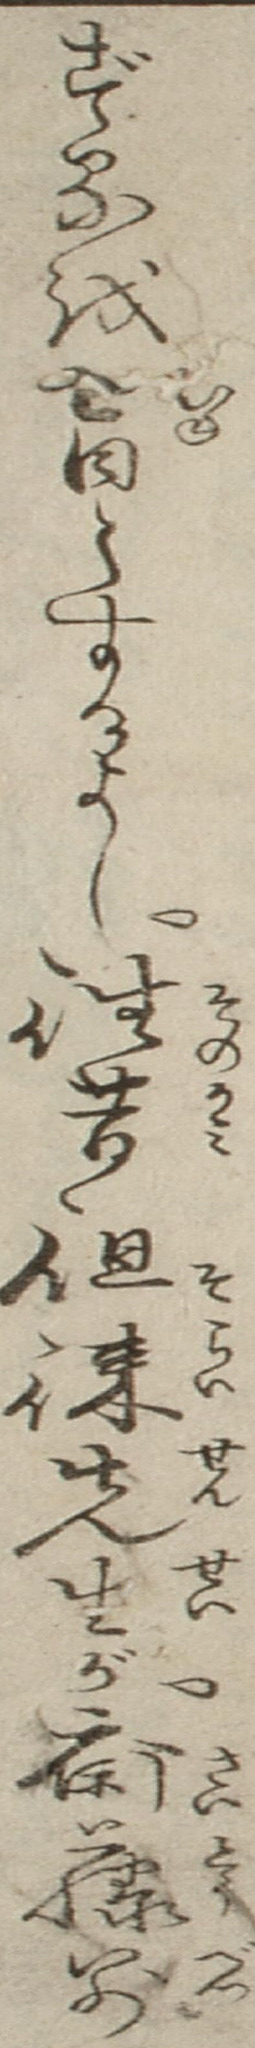ずるを旨とするよし。往昔徂徠先生が。斎藤別
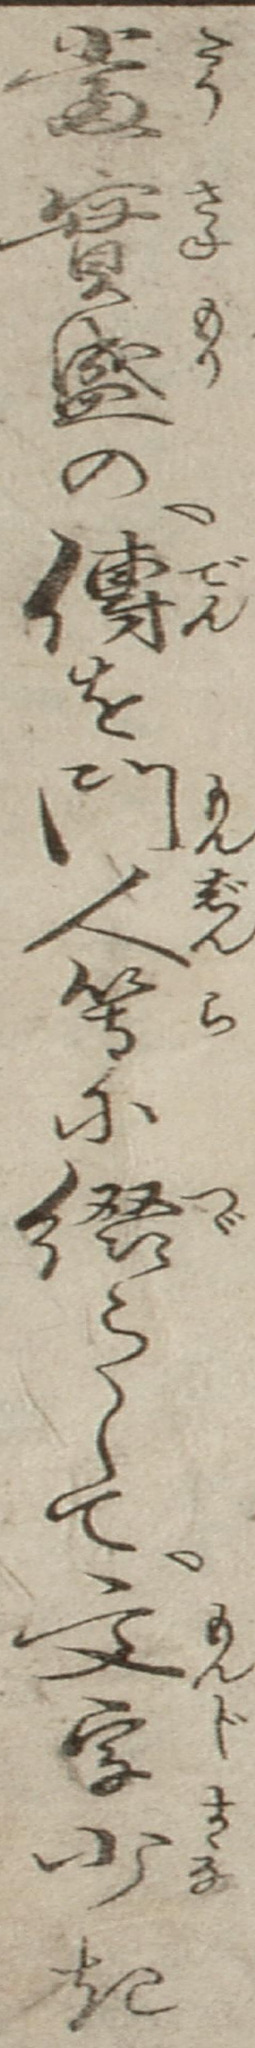当実盛の。伝を門人等に綴らして。文字少き
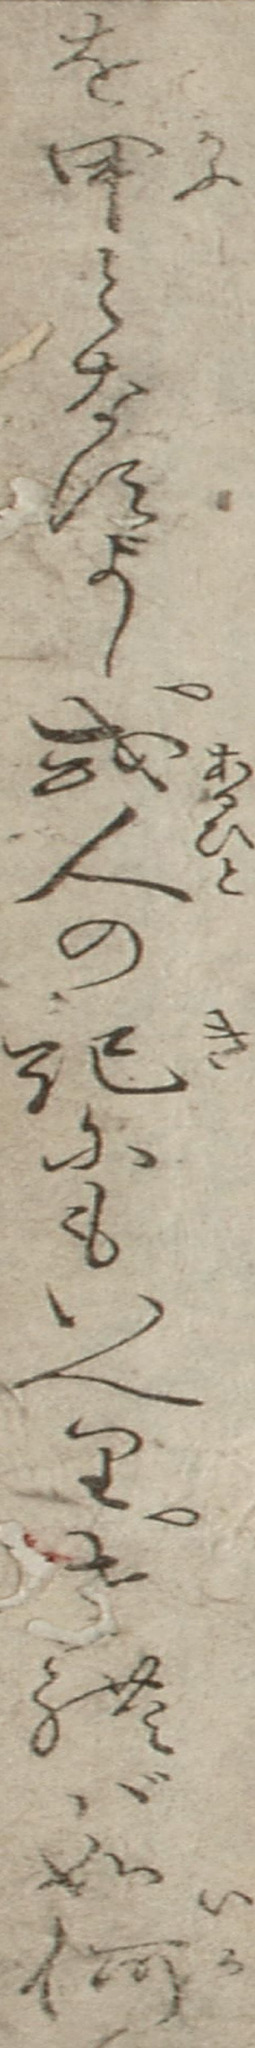を甲となすよし。或人の記にもいへり。されば如何

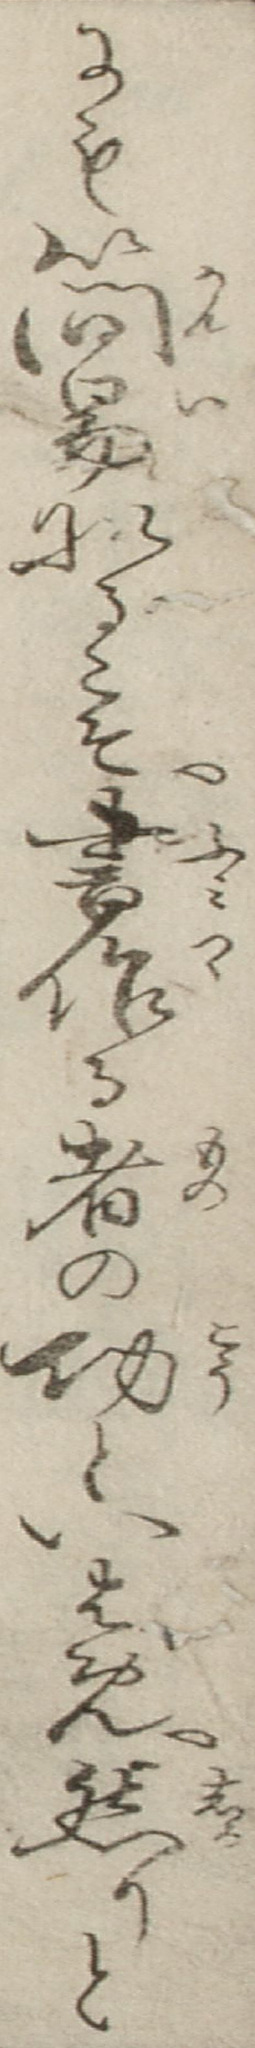にも簡易なるこそ。書作る者の功といはめ。然りと
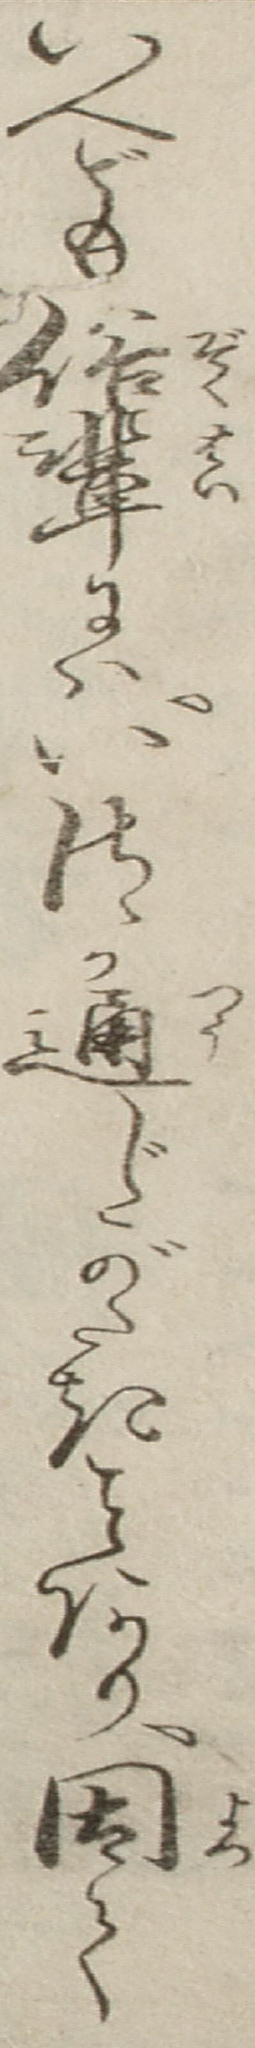いへども俗輩には。いさゝか通じがたきことあり。因て
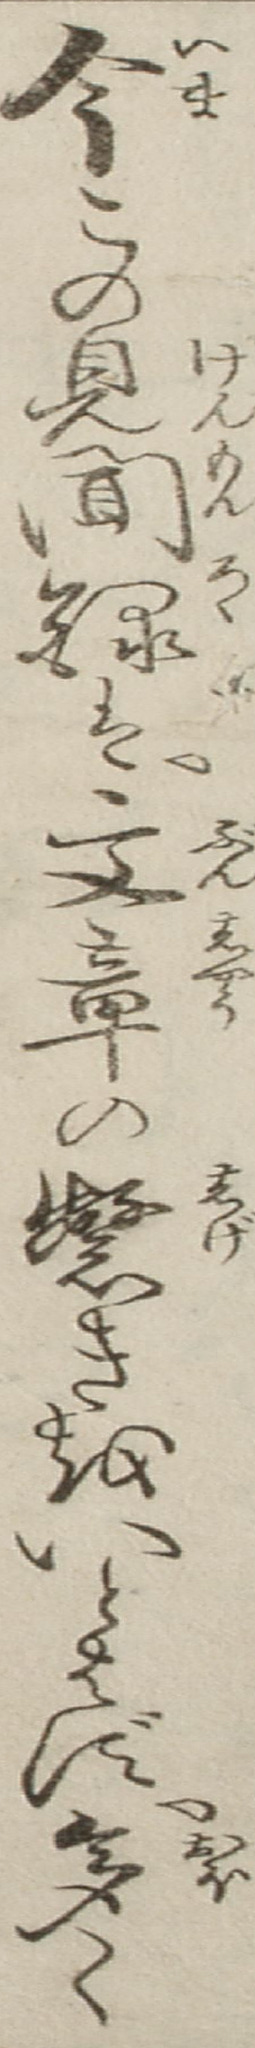今この見聞録は。文章の繁きをいとはず。多く
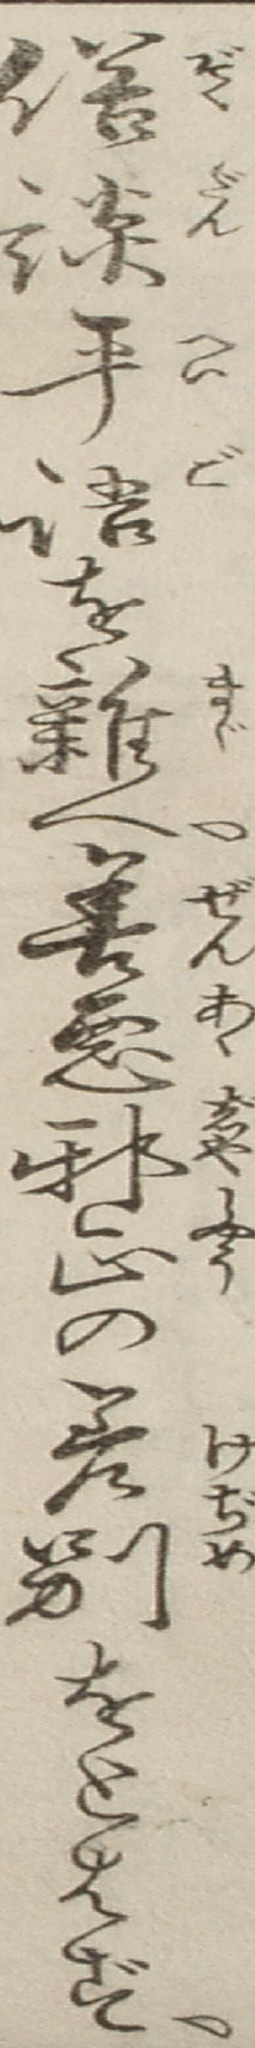俗談平語を雑へ。善悪邪正の差別をとはず。
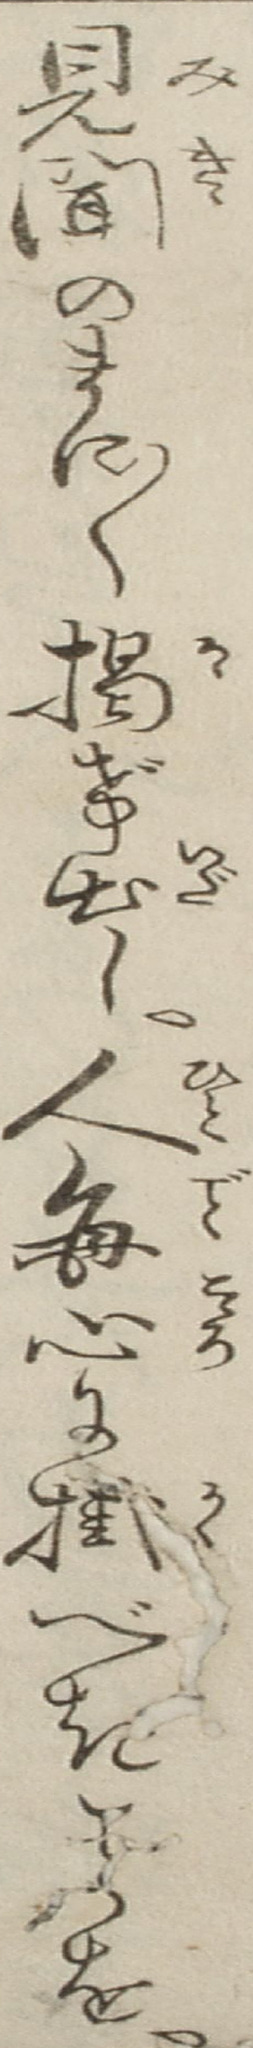見聞のまに〳〵掲げ出し。人毎心に掛べきことを。
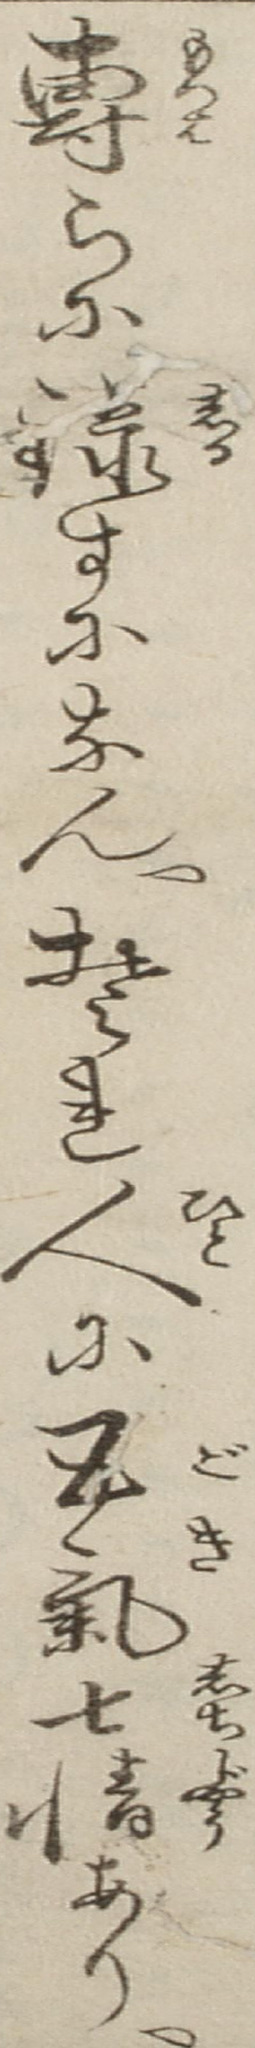専らに録すになん。それ人に五気七情あり。
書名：安政見聞録　上
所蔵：東京大学地震研究所図書室 Earthquake Research Institute Library, The University of Tokyo, JAPAN
